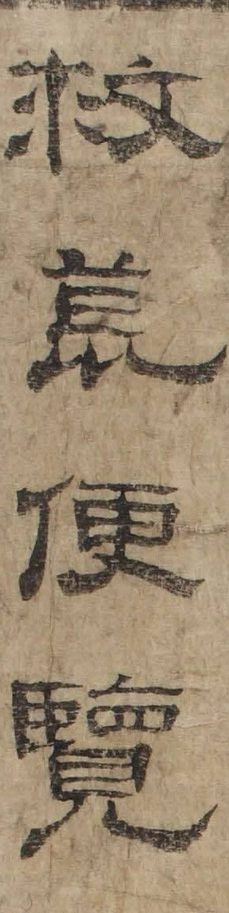救荒便覧

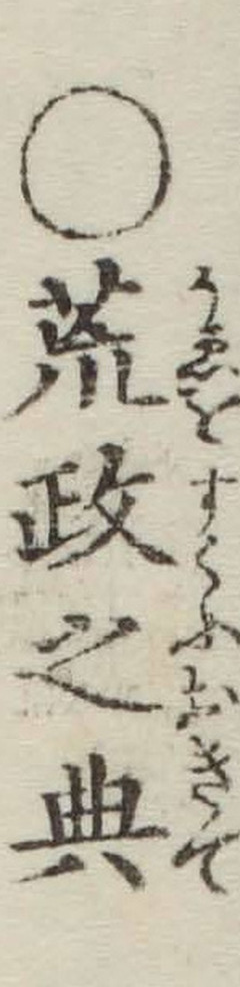○荒政之典

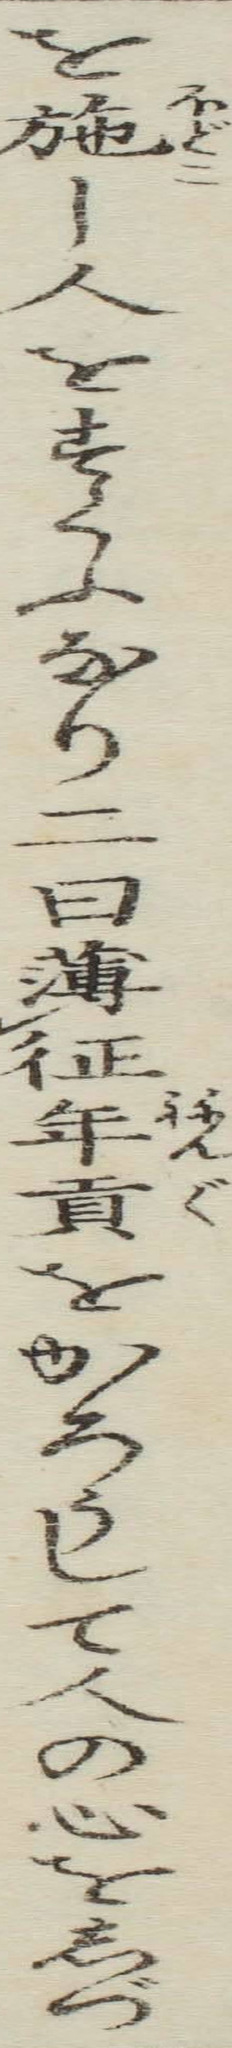を施し人をすくふなり二曰薄征年貢をかろうして人の心をしづ
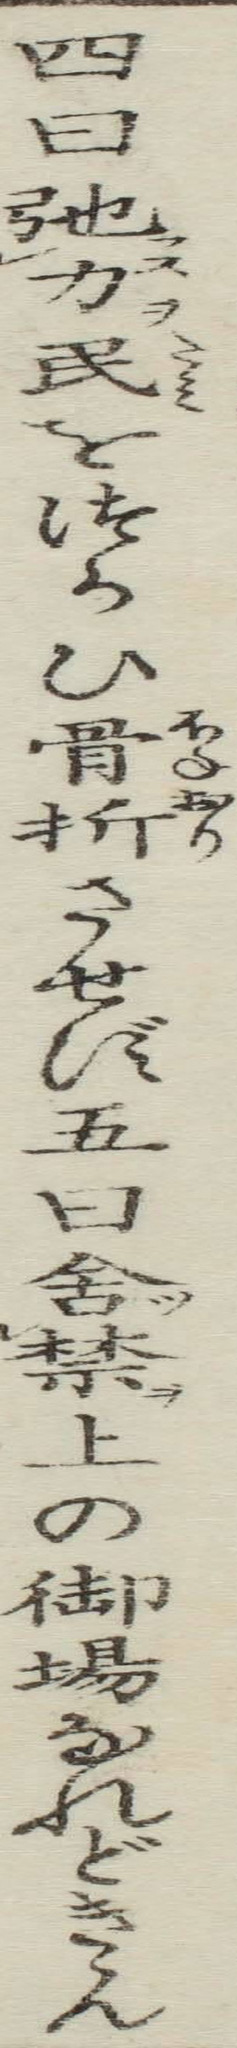四曰弛力民をつかひ骨折させず五曰舎禁上の御場なれどきゝん
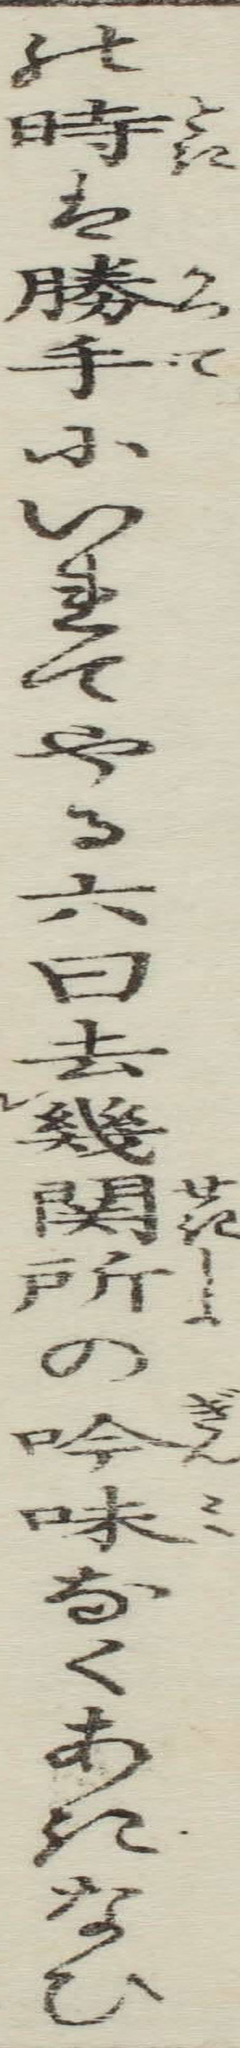の時は勝手にいれてやる六曰去幾関所の吟味なくあきなひ
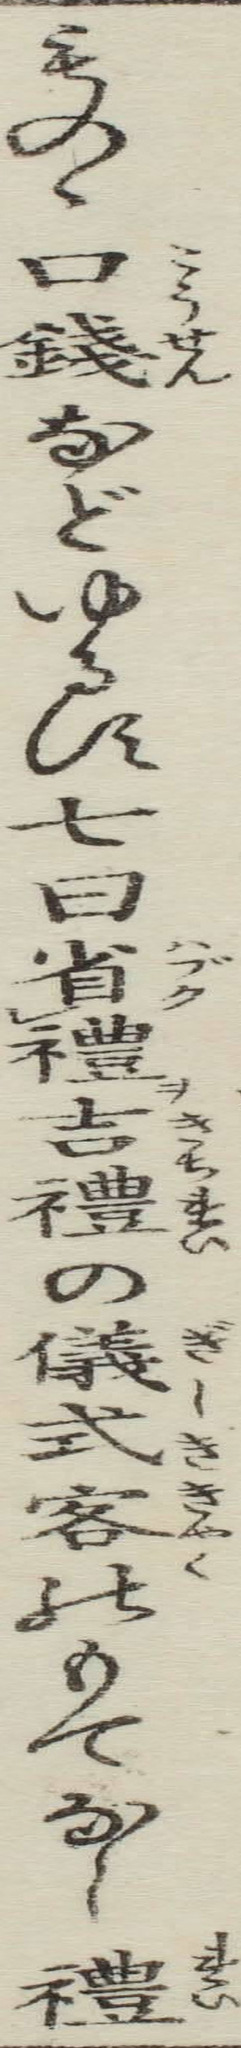ものゝ口銭などゆるす七曰省礼吉礼の儀式客のもてなし礼
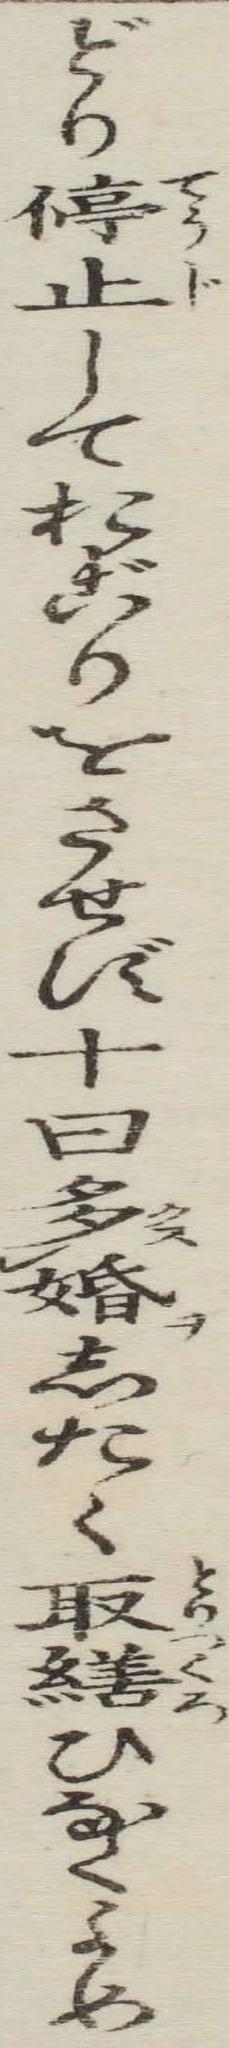どり停止しておごりをさせず十曰多婚取繕ひなくよめ
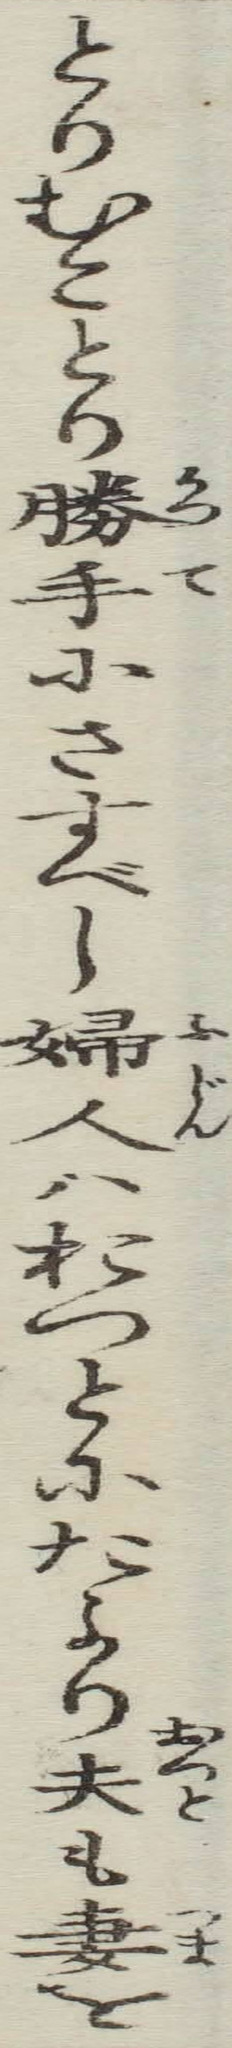とりむことり勝手にさすべし婦人はおつとにたより夫も妻を
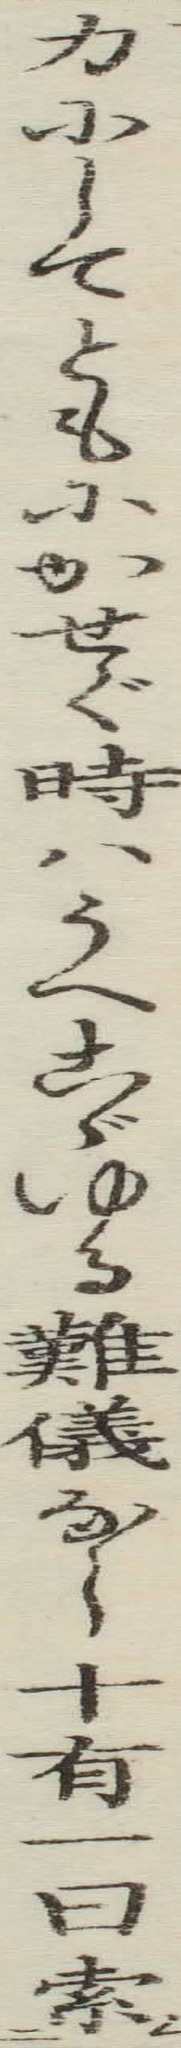力にしてともにかせぐ時はうへこゞゆる難儀なし十有一曰索
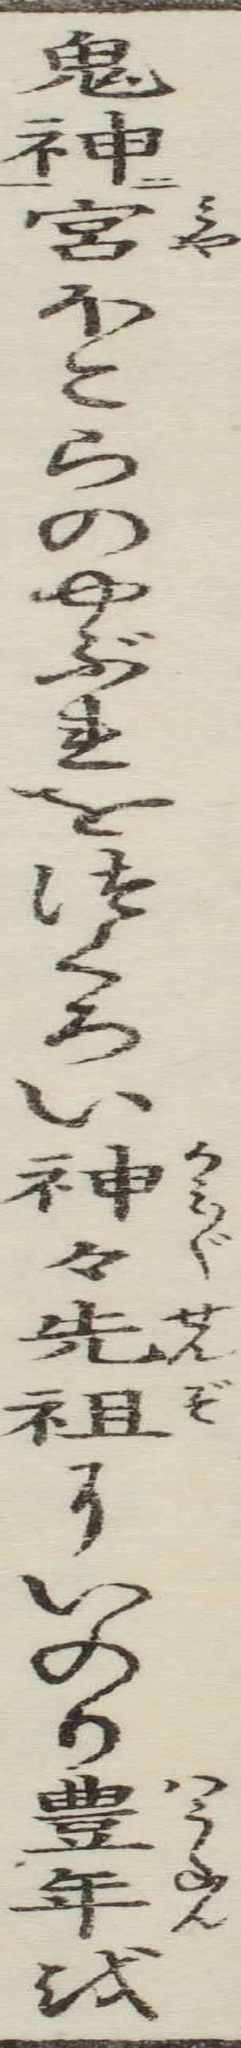鬼神宮ほこらのやぶれをつくろい神々先祖にいのり豊年を
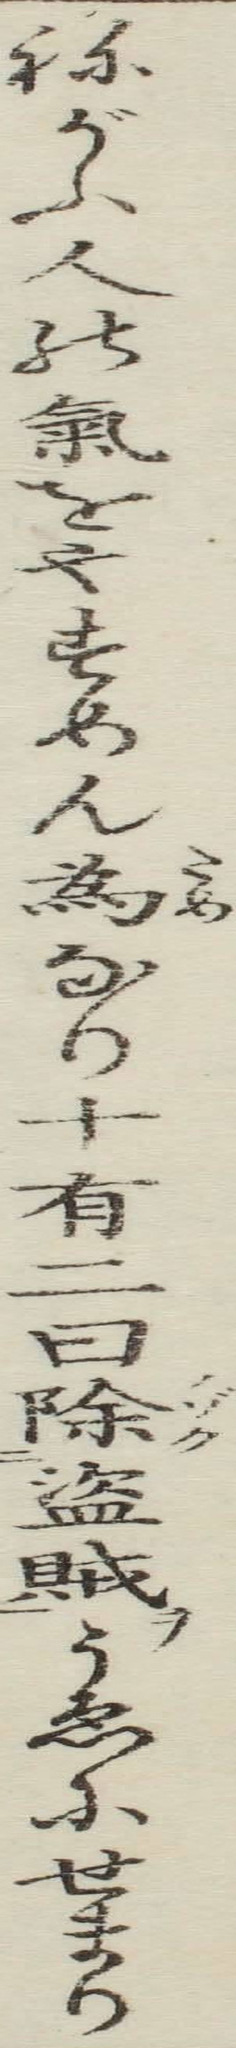ねがふ人の気をやすめん為なり十有二曰除盗賊
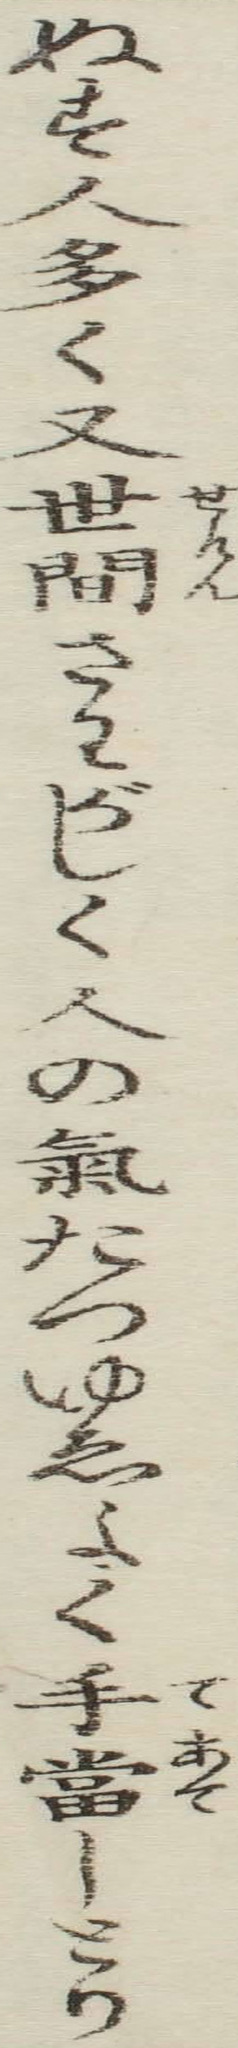ぬす人多く又世間さわがしく人の気たつゆゑよく手当しとり
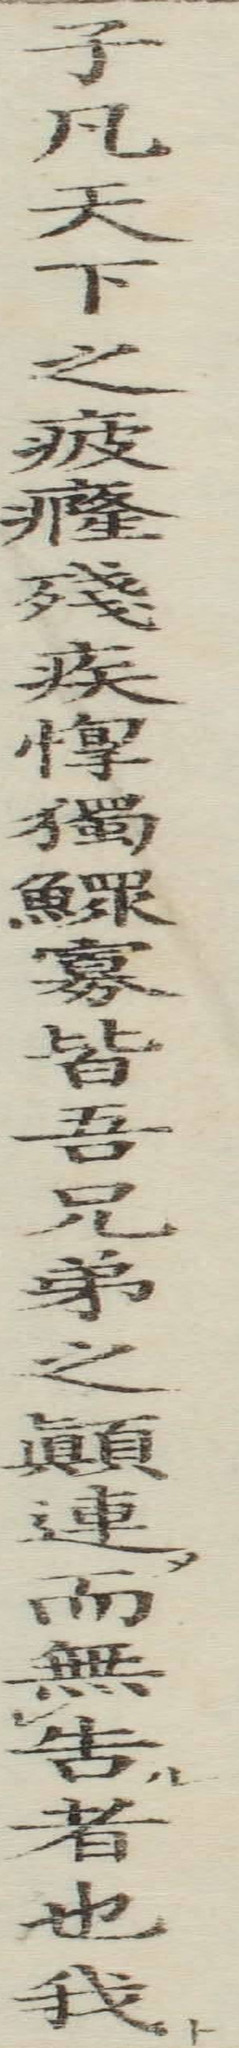子凡天之疲癃残疾惸独鰥寡皆吾兄弟之顚連而無告者也我

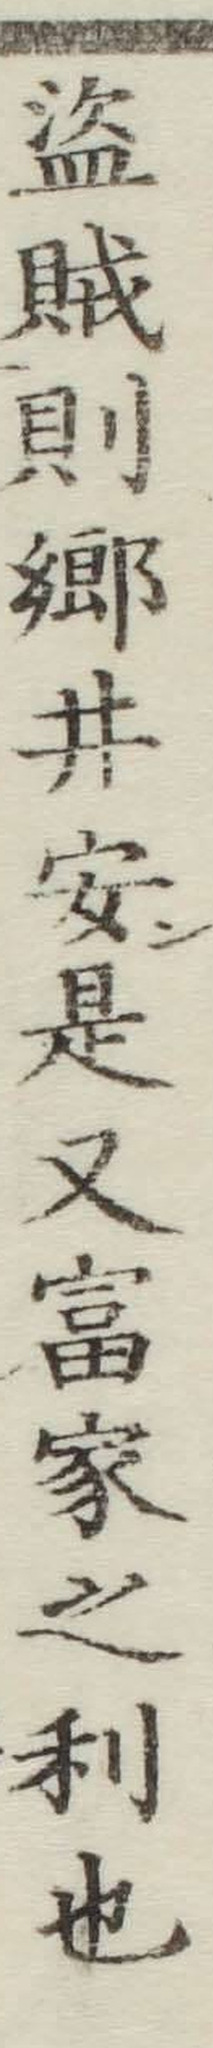盗賊則郷井安是又富家之利也
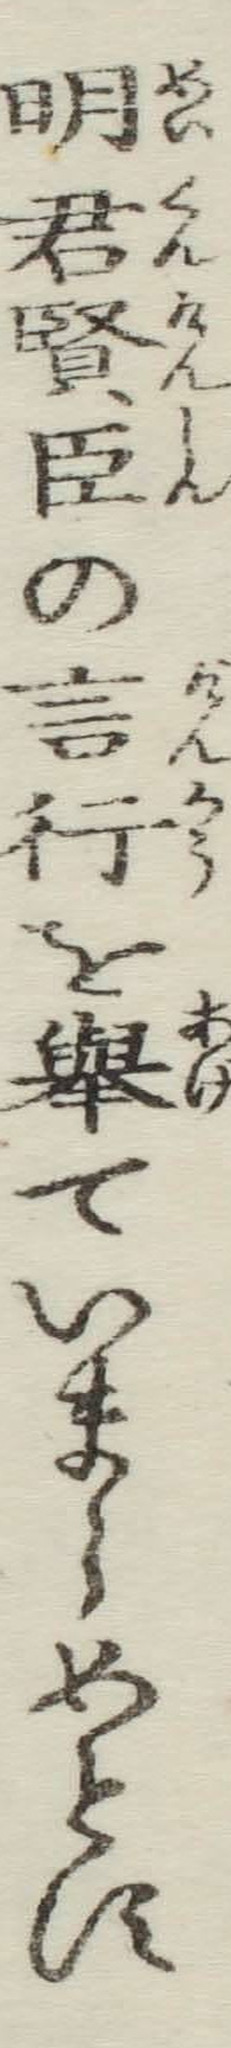明君賢臣の言行を挙ていましめとす
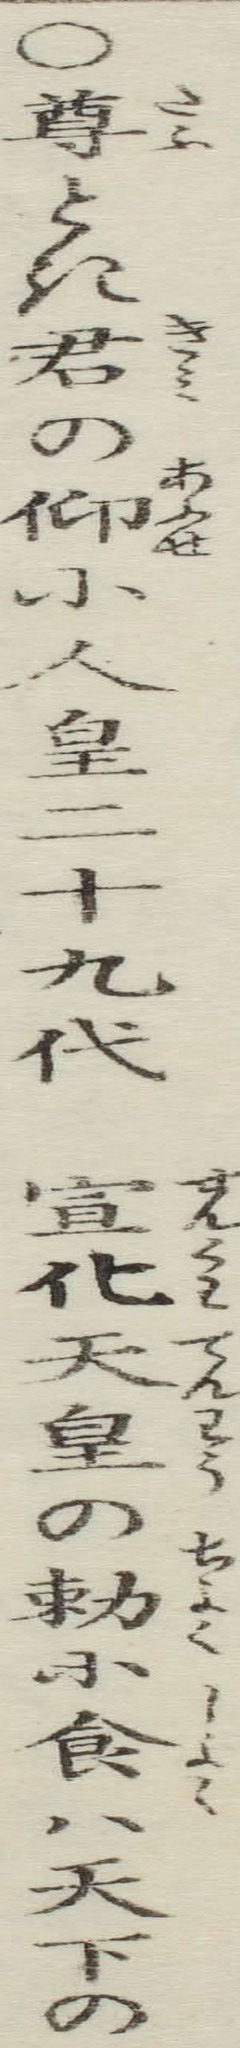○尊とき君の仰に人皇二十九代宣化天皇の勅に食は天下の
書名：救荒便覧
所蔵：国文学研究資料館
